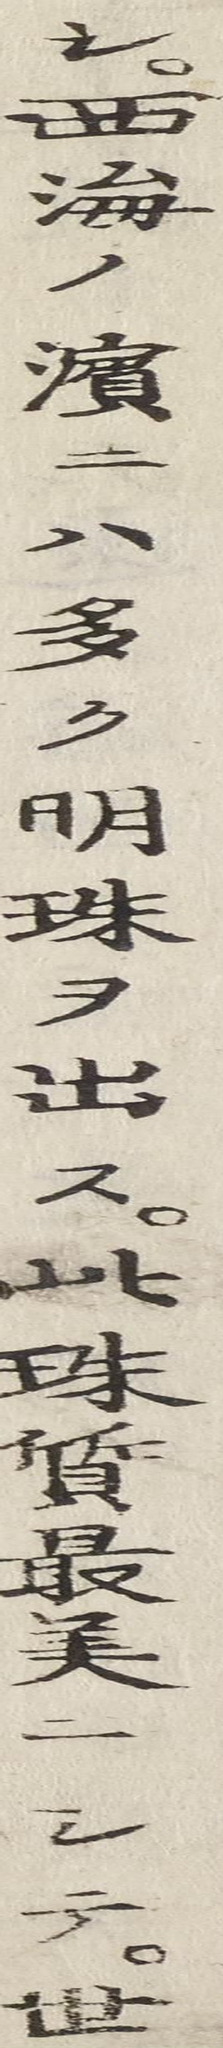シ。西海ノ浜ニハ多ク明珠ヲ出ス。此珠質最美ニシテ。世
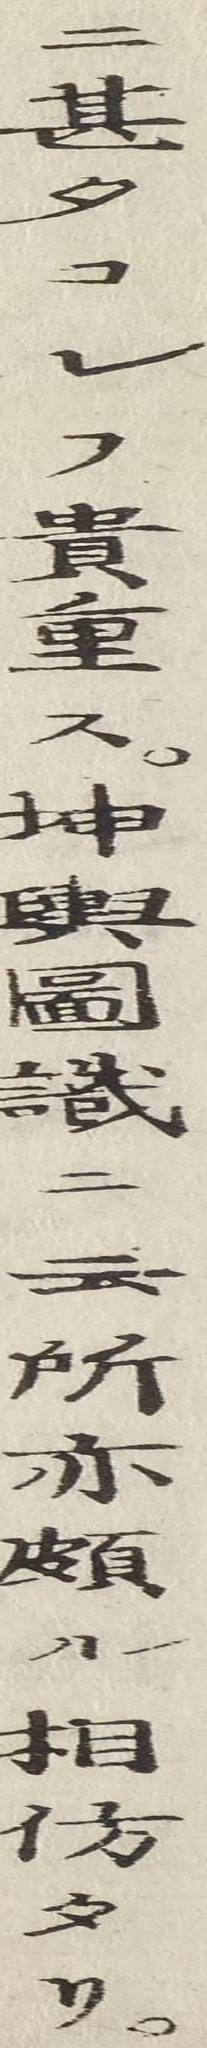ニ甚タコレヲ貴重ス。坤輿図識ニ云所亦頗ル相仿タリ。
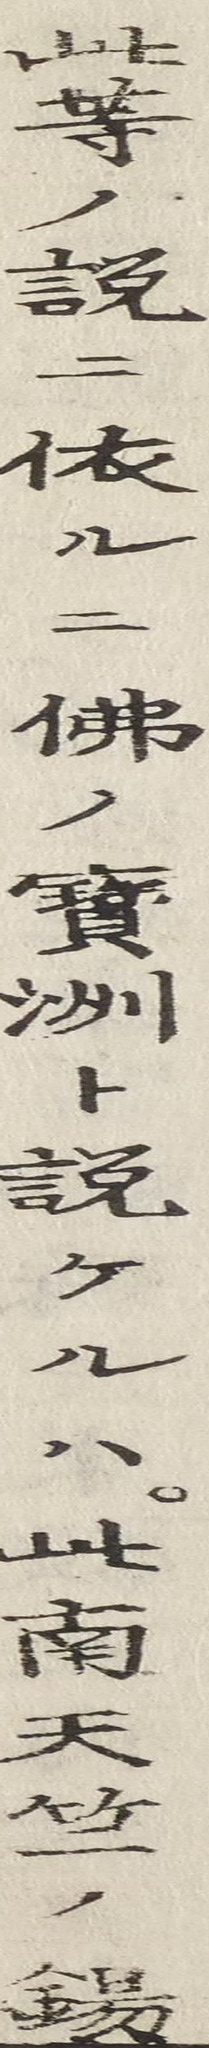此等ノ説ニ依ルニ仏ノ宝洲ト説ケルハ。此南天竺ノ錫
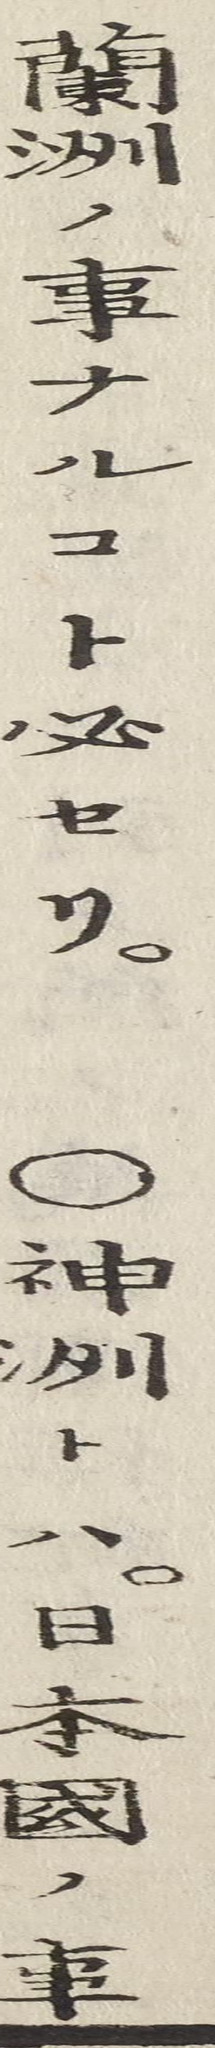蘭洲ノ事ナルコト必セリ。〇神洲トハ。日本国ノ事
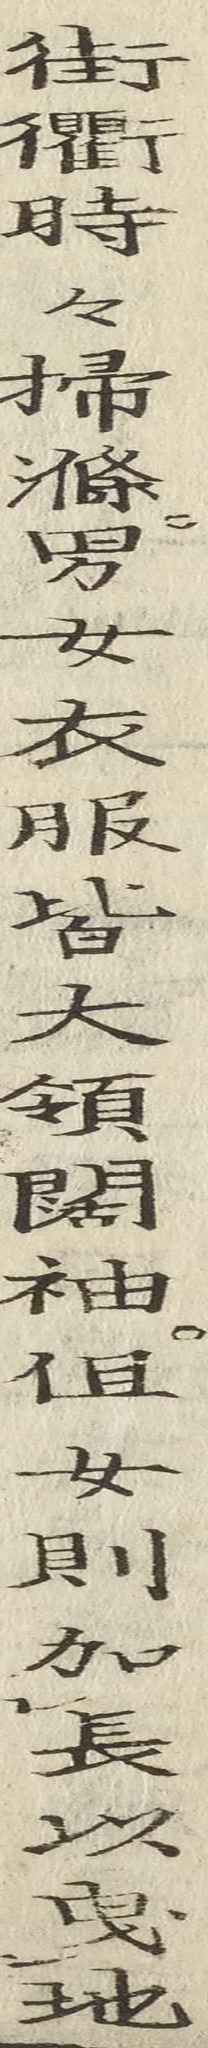街衢時々掃滌。男女衣服皆大領闊袖。伹女則加長以曳地
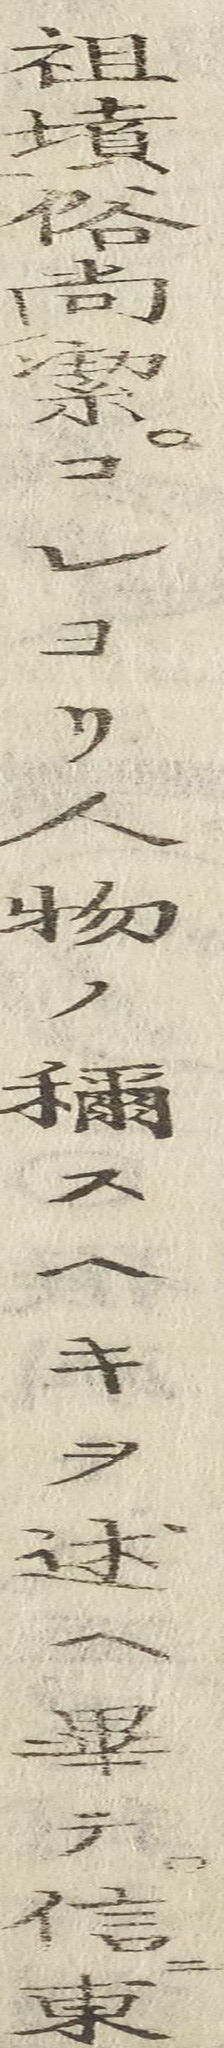祖墳俗尚潔。コレヨリ人物ノ称スヘキヲ述ヘ畢テ。信東
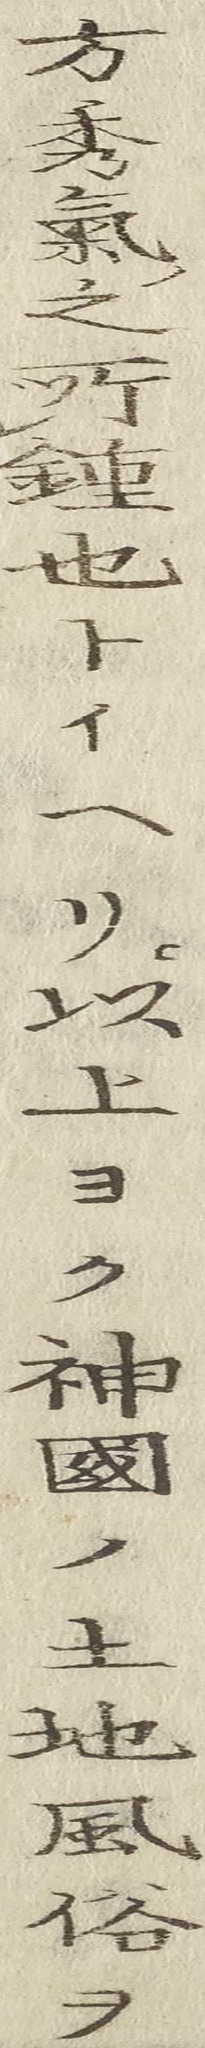方秀気之所鍾也トイヘリ。以上ヨク神国ノ土地風俗ヲ
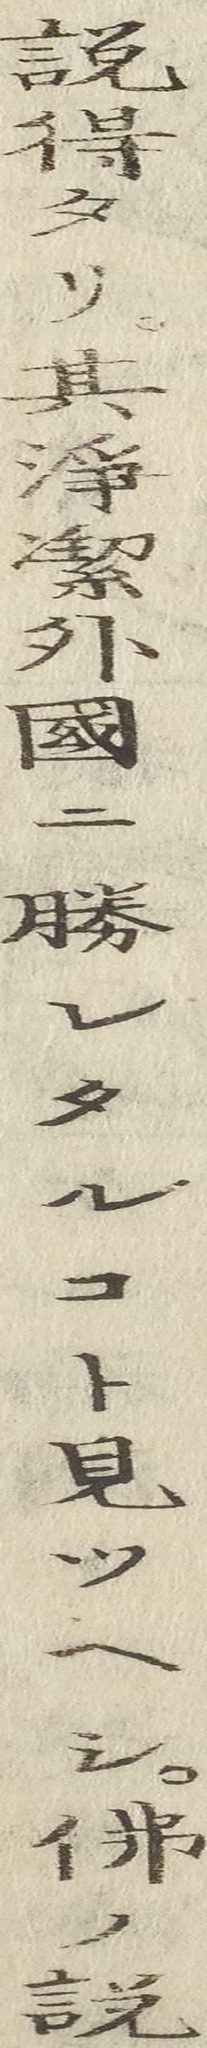説得タリ。其浄潔外国ニ勝レタルコト見ツヘシ。仏ノ説

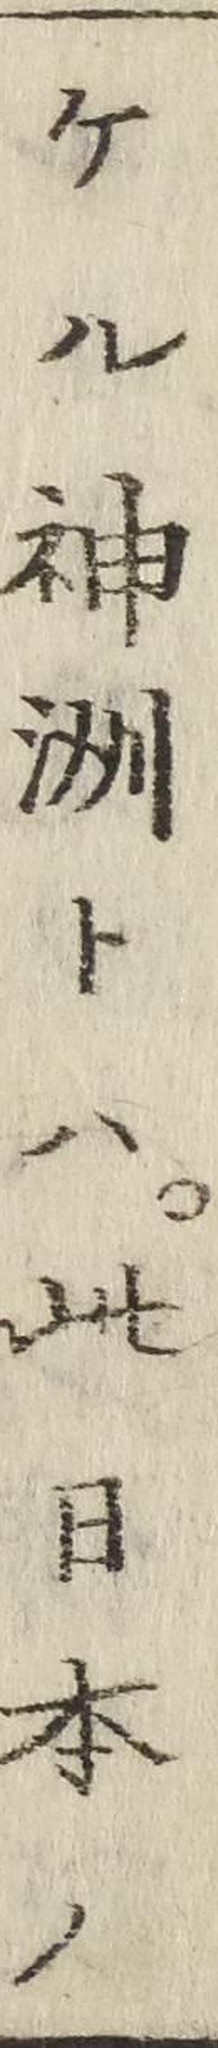ケル神洲トハ。此日本ノ
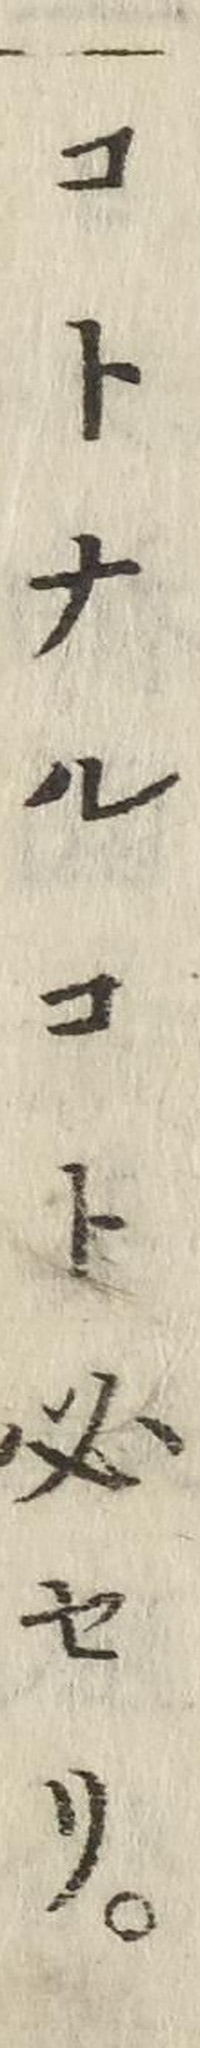コトナルコト必セリ。
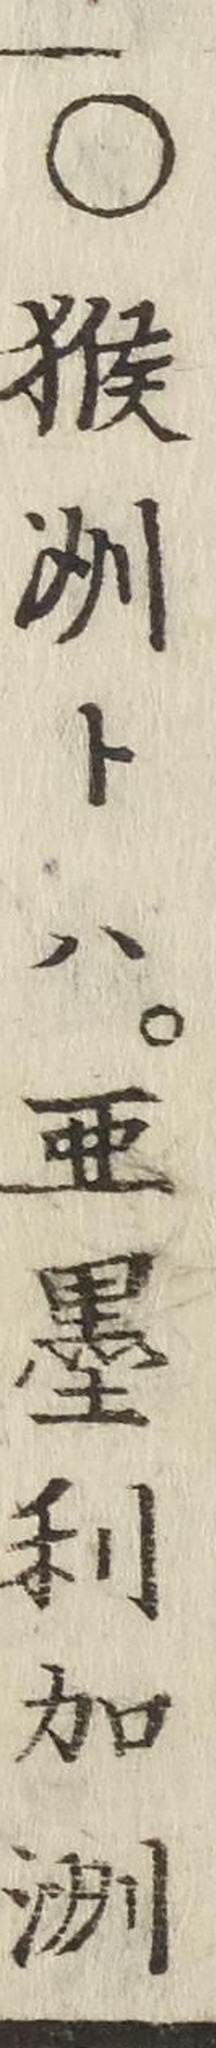〇猴洲トハ。亜墨利加洲
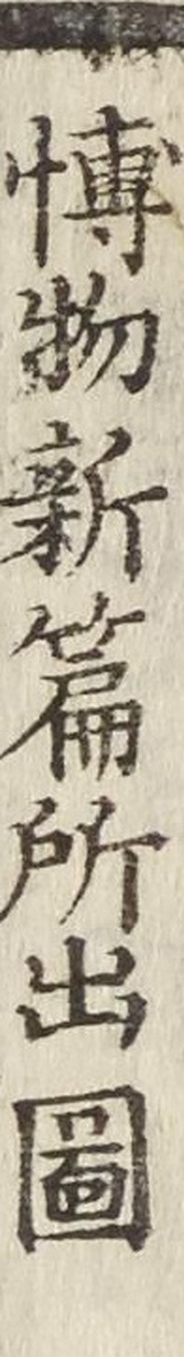慱物新篇所出図
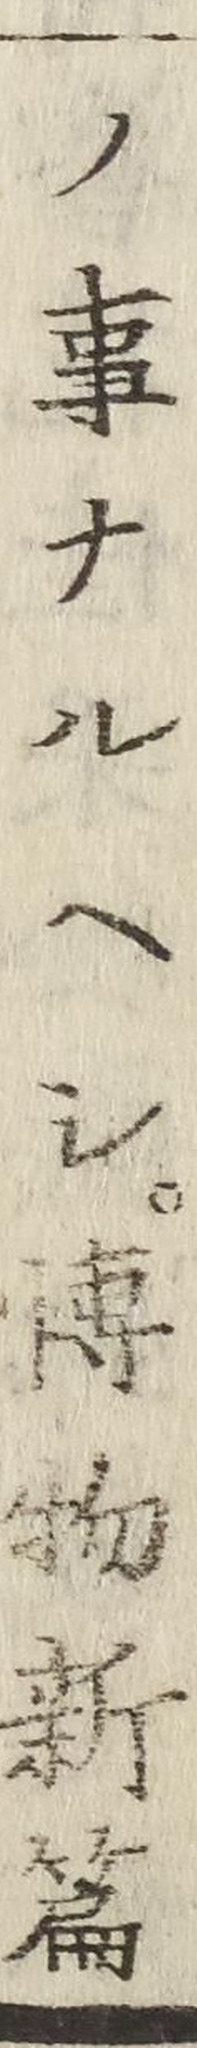ノ事ナルヘシ。慱物新篇
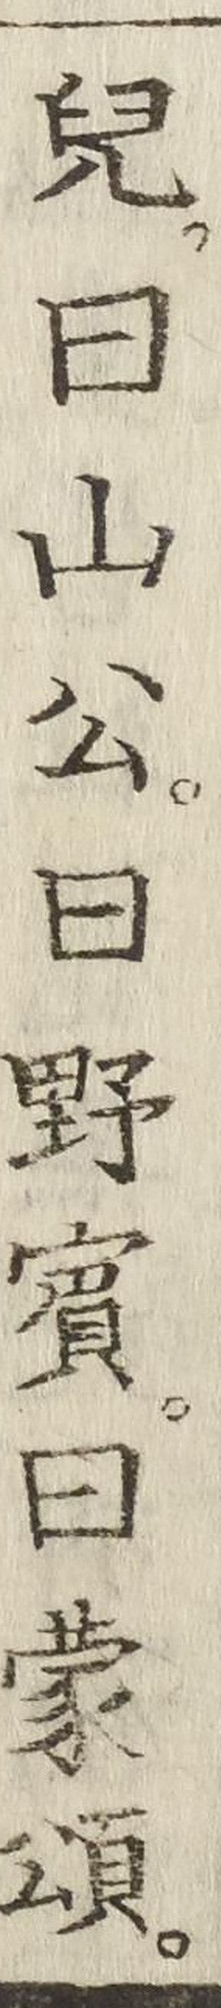兒。曰山公。曰野賡。曰蒙頌。
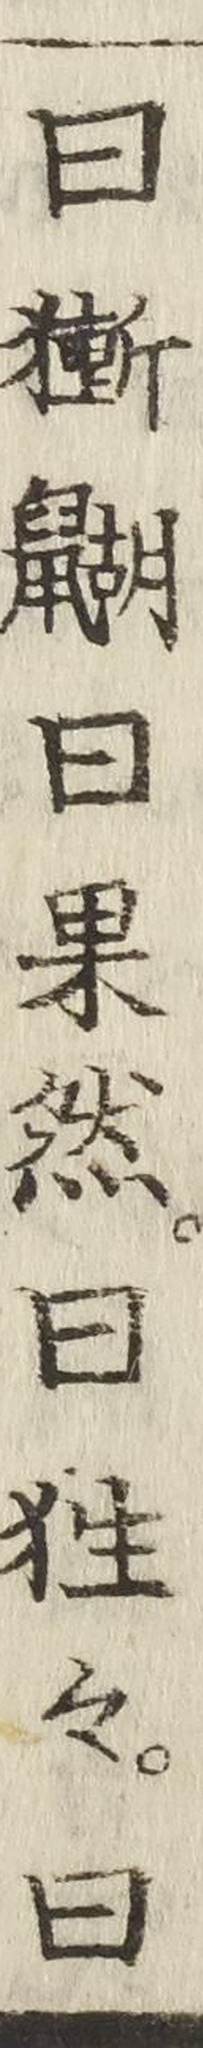曰獑𪕱曰果然。曰狌々。曰
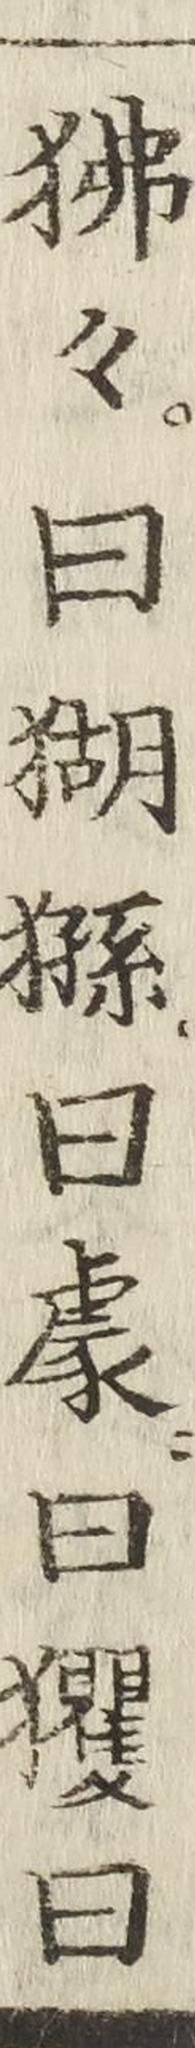狒々。曰猢猻。曰豦。曰玃曰
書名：護法新論　二編　中
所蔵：東京大学地震研究所図書室 Earthquake Research Institute Library, The University of Tokyo, JAPAN
